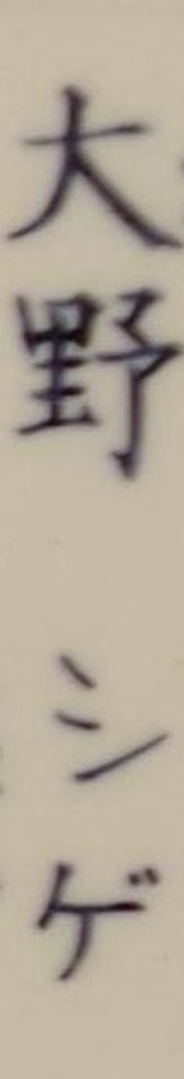大野シゲ
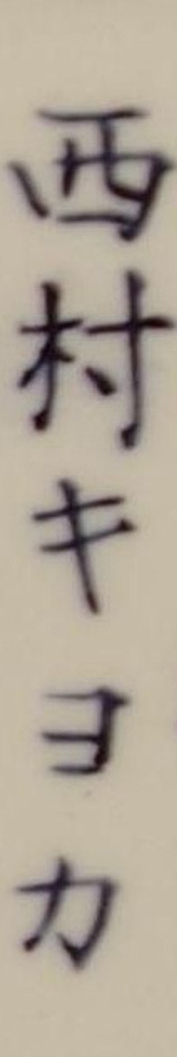西村キヨカ
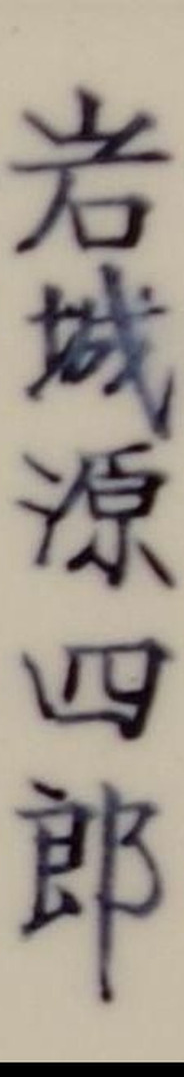岩城源四郎
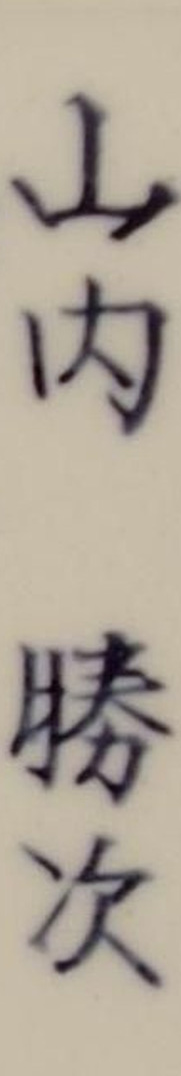山内勝次
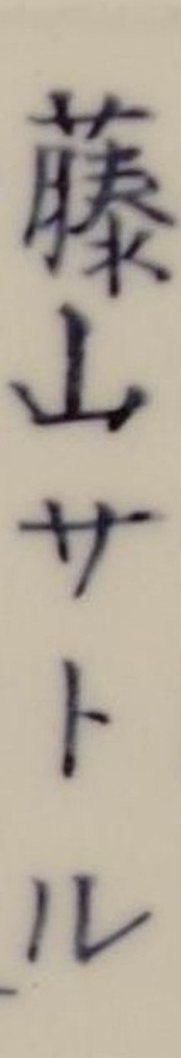藤山サトル
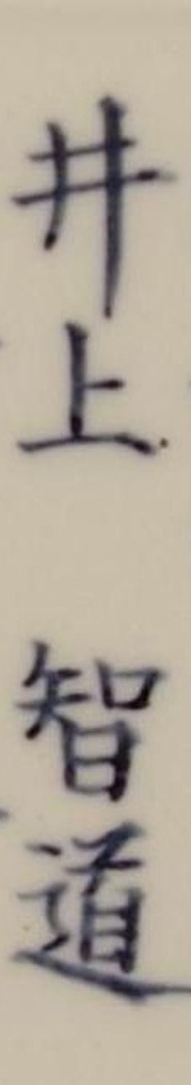井上智道
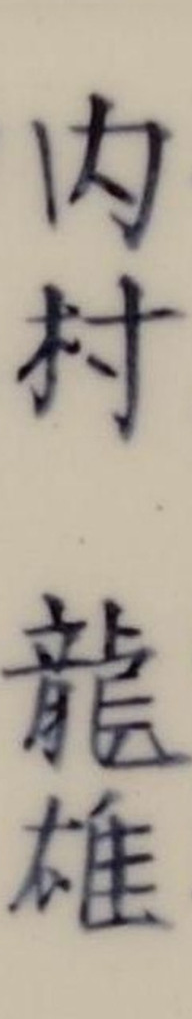内村龍雄
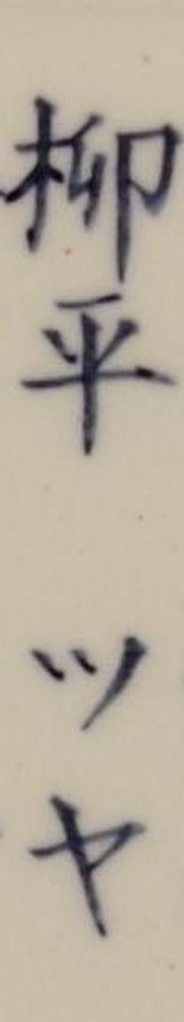柳平ツヤ
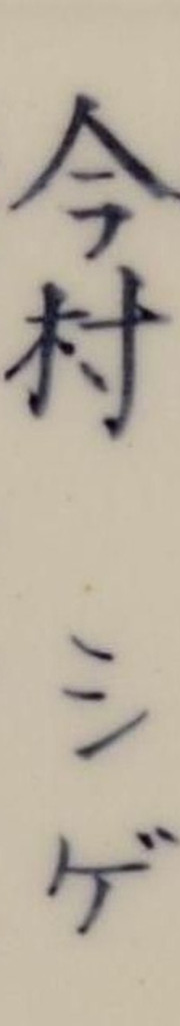今村シゲ
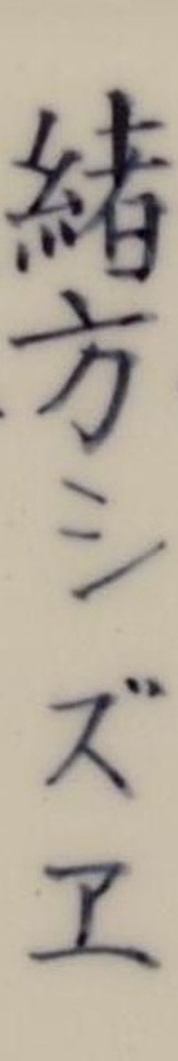緒方シズヱ
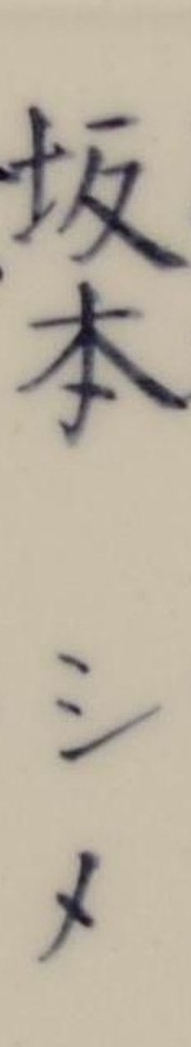坂本シメ
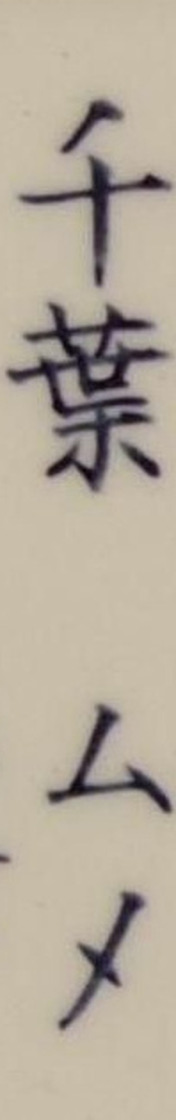千葉ムメ
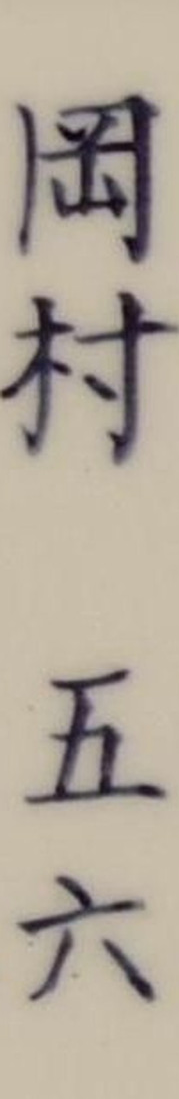岡村五六
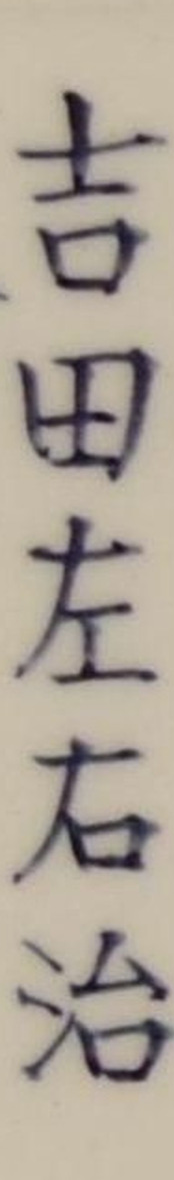吉田左右治
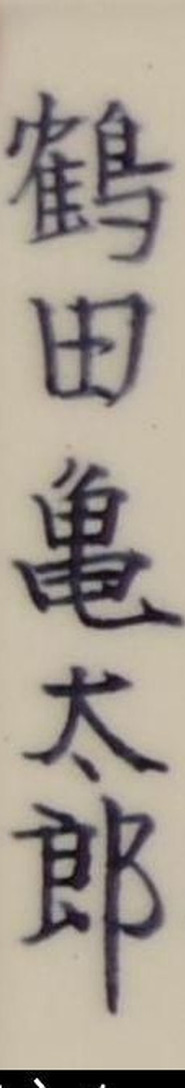鶴田亀太郎

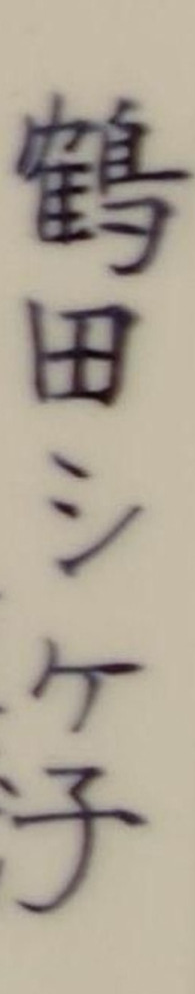鶴田シケ子
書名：M~S
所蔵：高野山金剛峯寺
